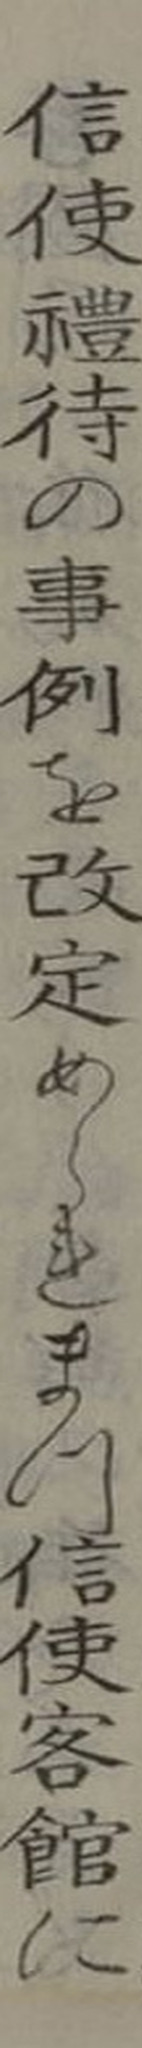信使禮待の事例を改定められまつ信使客館に
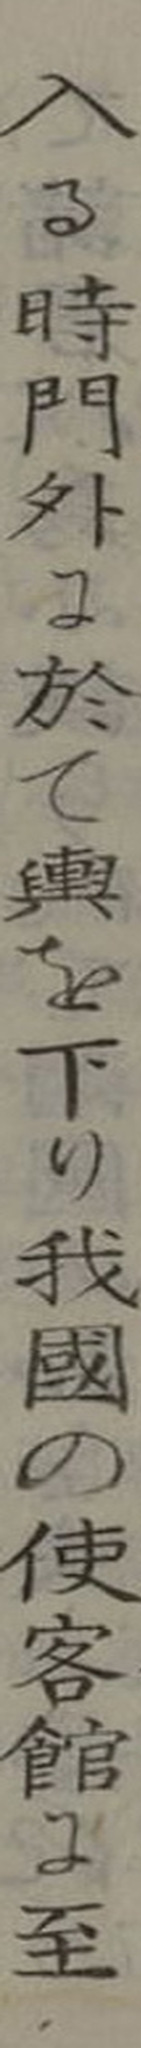入る時門外に於て輿を下り我國の使客館に至
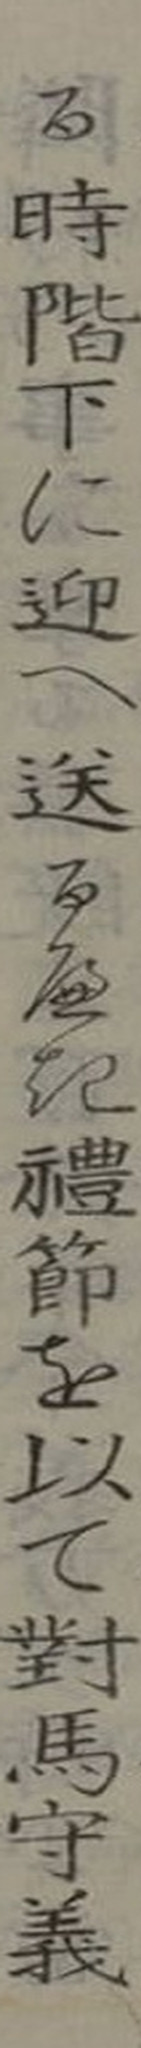る時階下に迎へ送るへき禮節を以て對馬守義
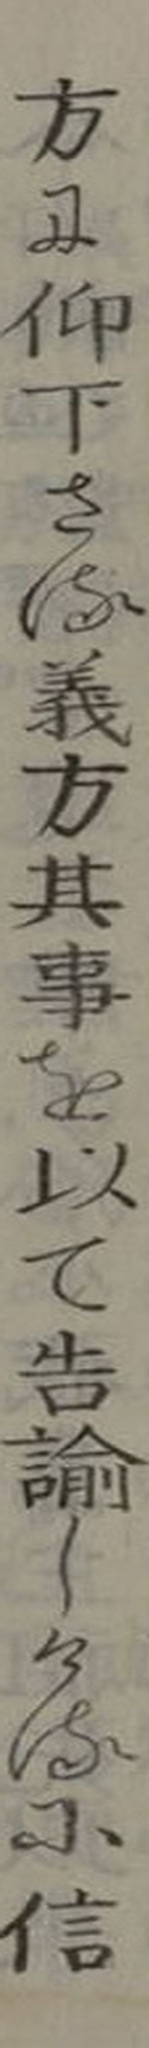方に仰下さる義方其事を以て告諭しけるに信
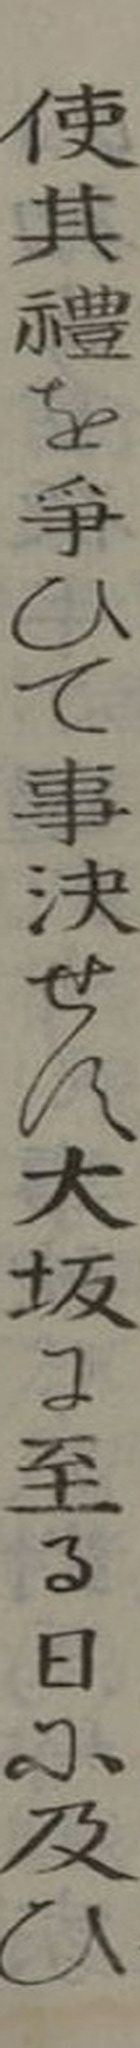使其禮を爭ひて事決せす大坂に至る日に及ひ
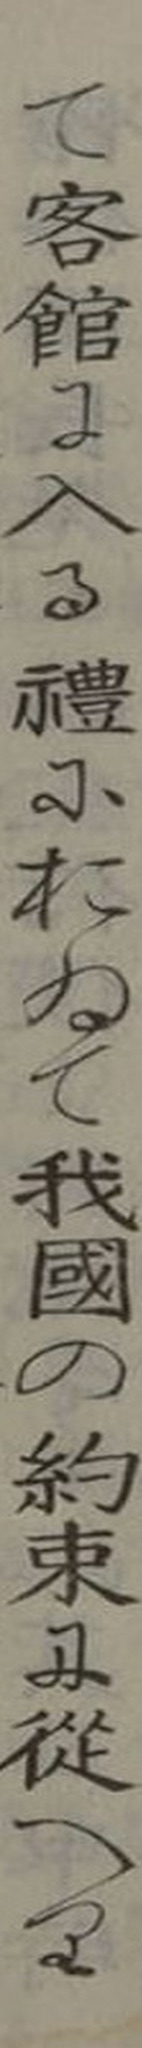て客館に入る禮におゐて我國の約束に從へり
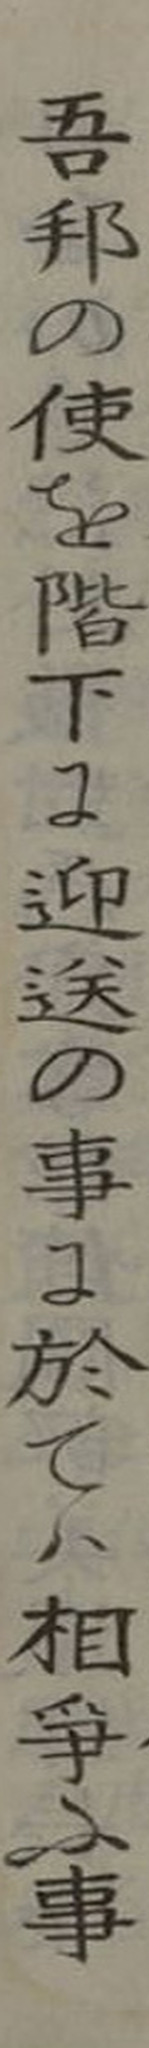吾邦の使を階下に迎送の事に於ては相爭ふ事

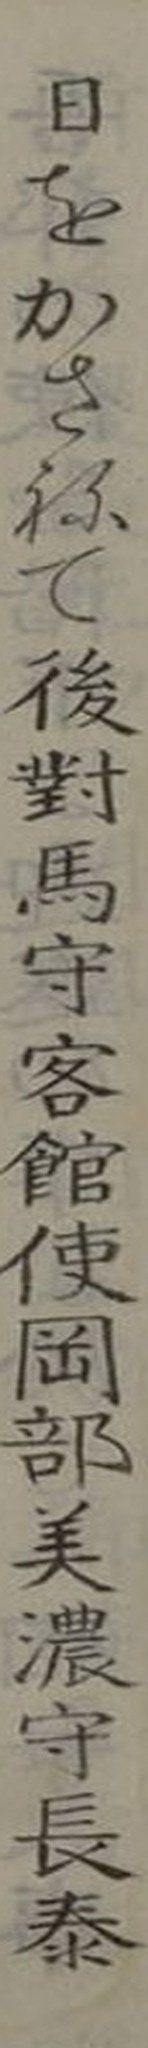日をかさねて後對馬守客館使岡部美濃守長泰
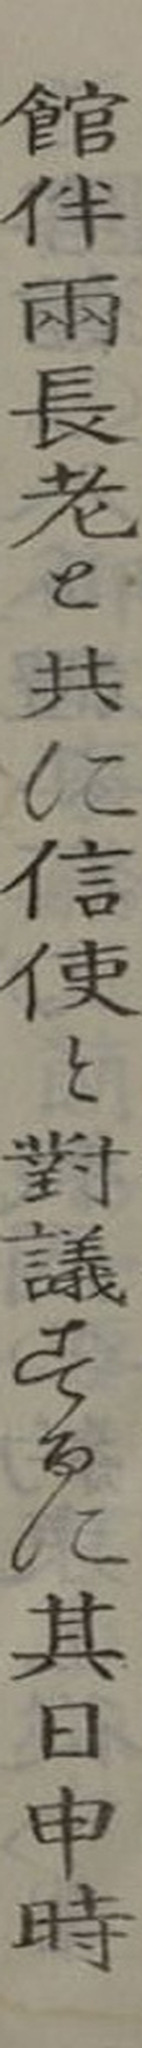館伴兩長老と共に信使と對議するに其日申時
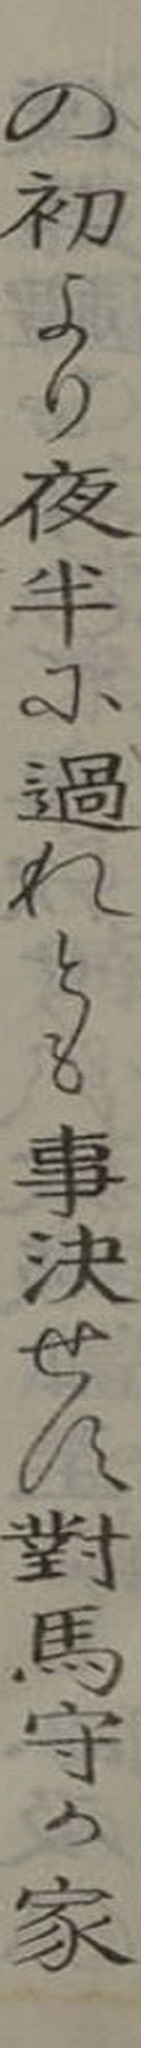の初より夜半に過れとも事決せす對馬守か家
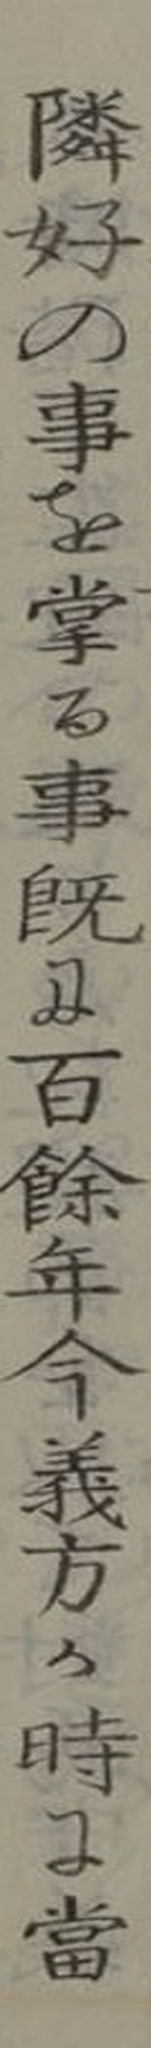隣好の事を掌る事既に百餘年今義方か時に當
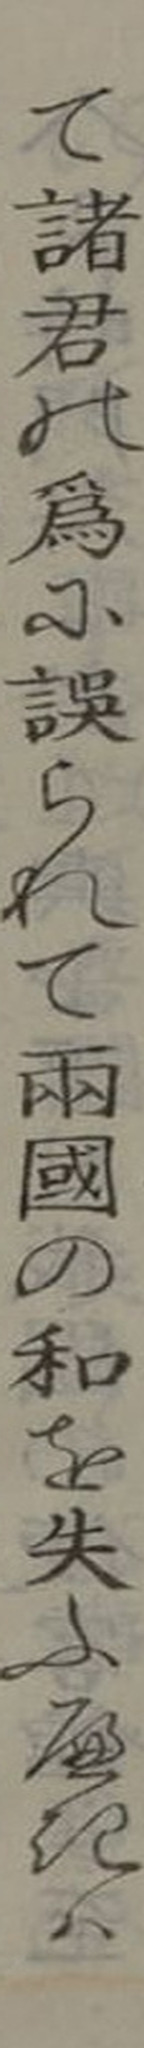て諸君の爲に誤られて兩國の和を失ふへきは
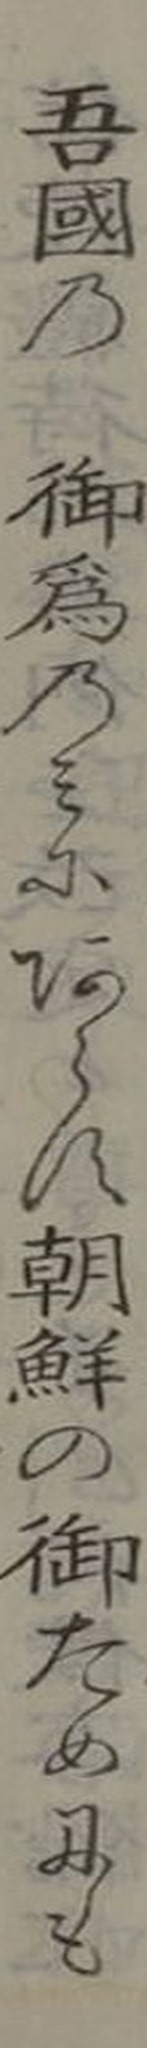吾國の御爲のみにあらす朝鮮の御ためにも
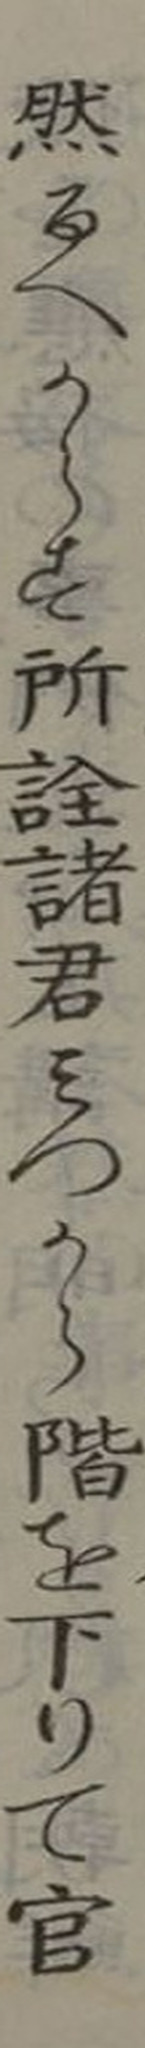然るへからす所詮諸君みつから階を下りて官
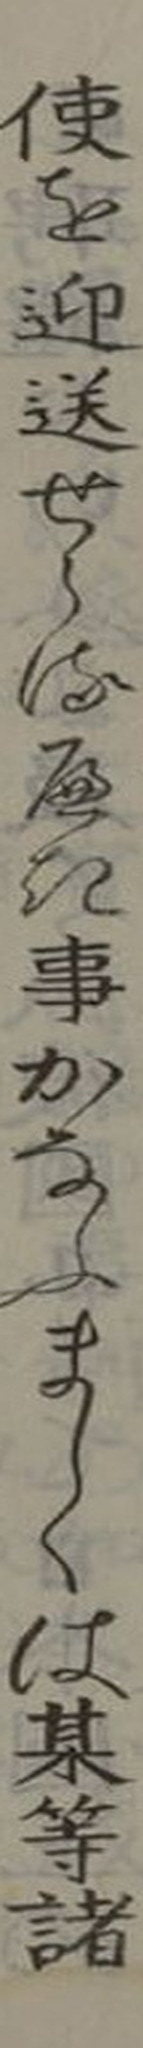使を迎送せらるへき事かなふましくは某等諸
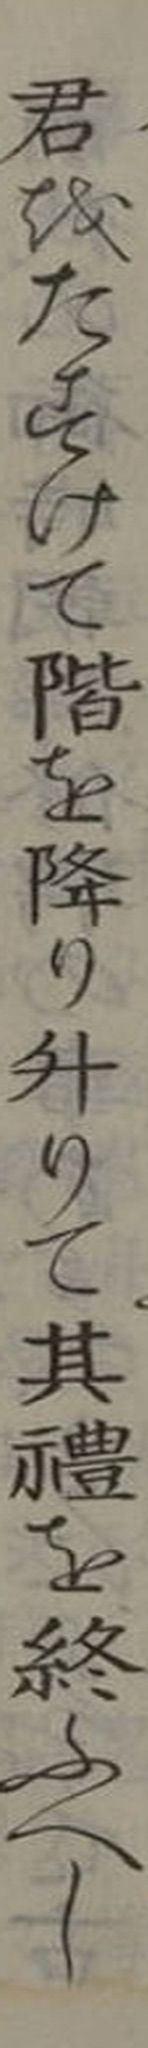君をたすけて階を降り升りて其禮を終ふへし
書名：骨董録
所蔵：University of the Ryukyus Library
